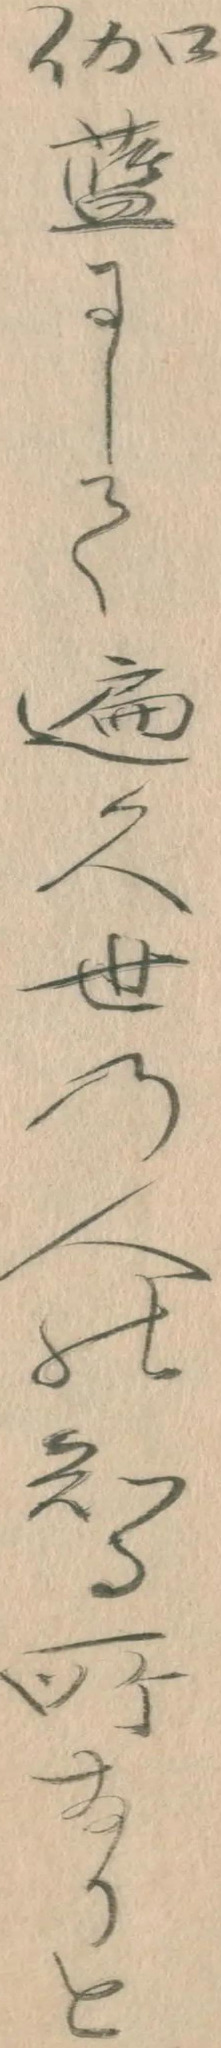伽藍にして遍久世の人の知る所なりと
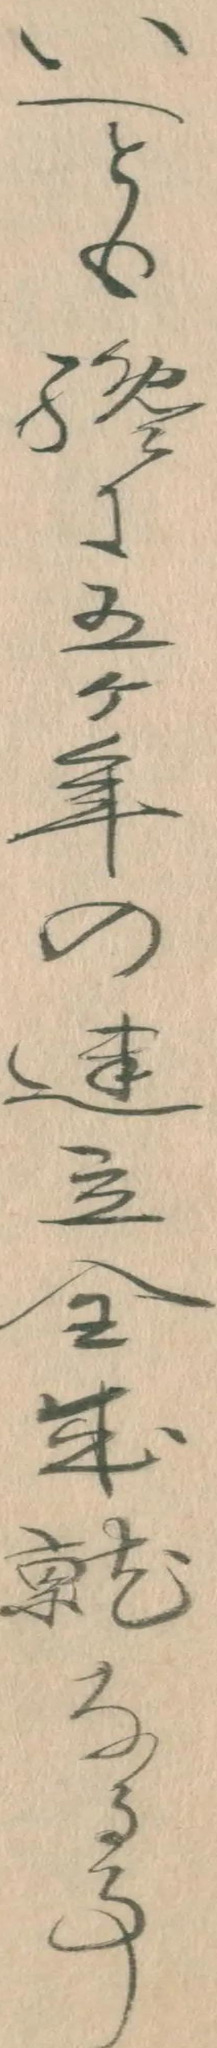いへとも纔に五ヶ年の建立全成就なる事
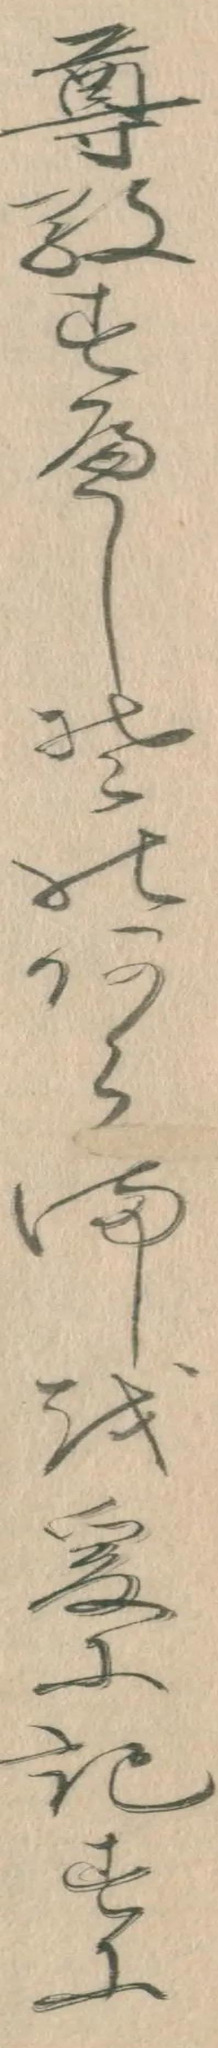尊敬すべしそのあらましを爰に記すに

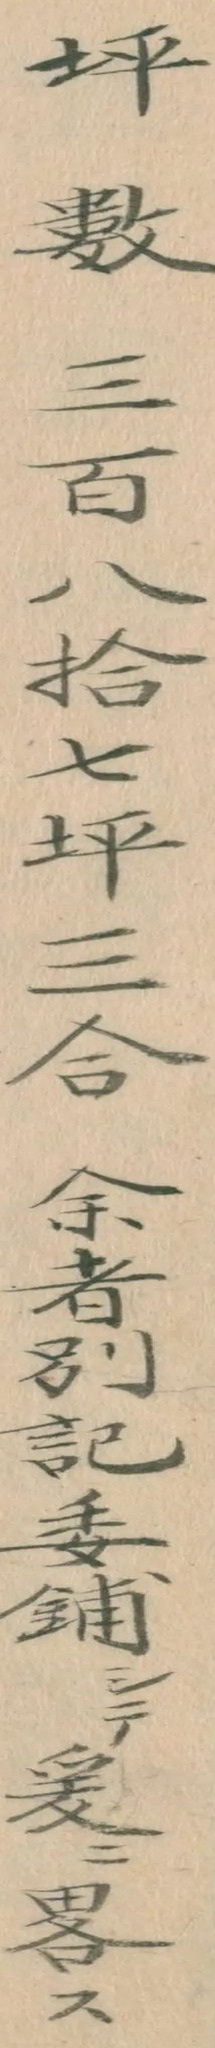坪数三百八拾七坪三合余者別記委鋪して爰に略す
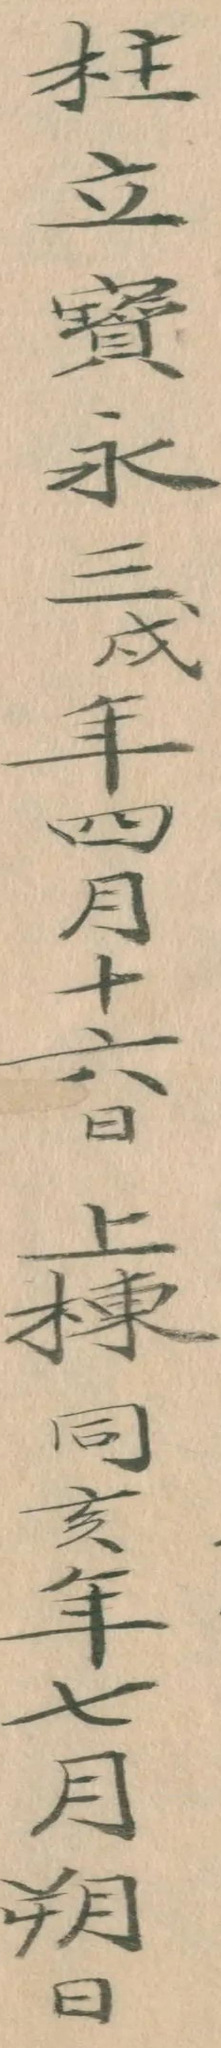柱立宝永三戌年四月十六日上棟同亥年七月朔日
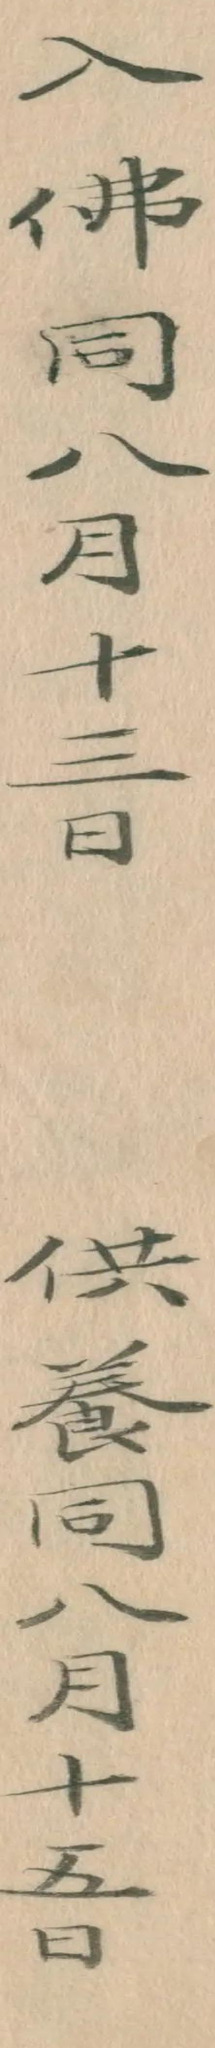入仏同八月十三日供養同八月十五日
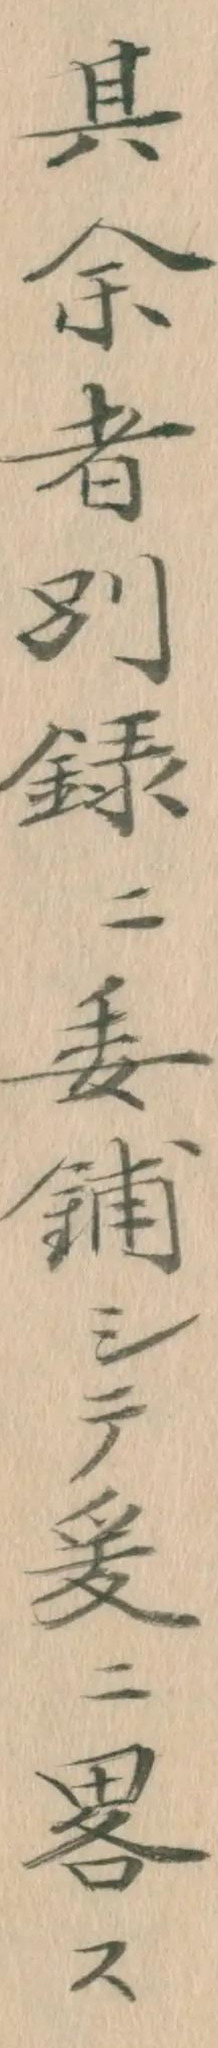其余者別録に委鋪して爰に略す
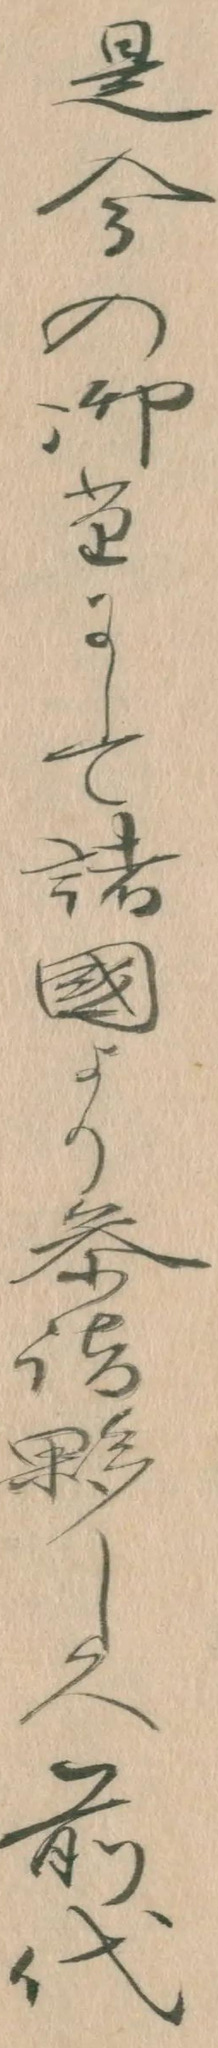是今の御堂にて諸国より参詣夥しく前代
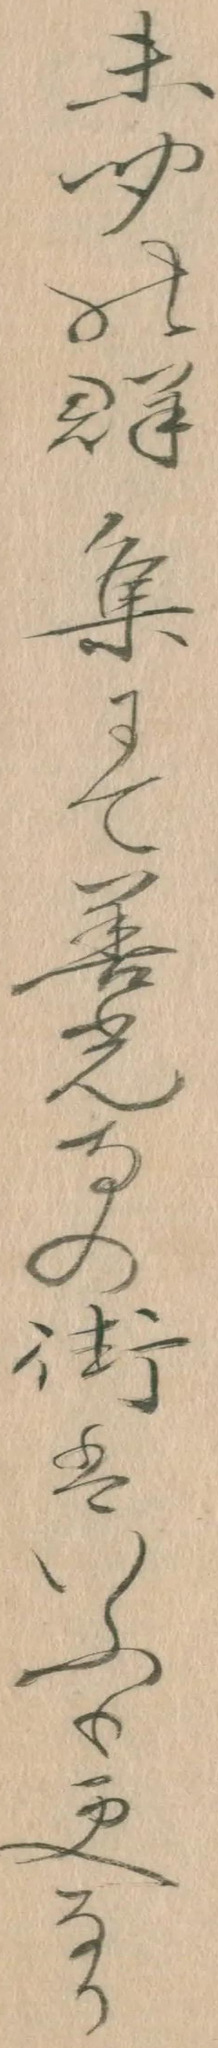未聞の群集にて善光寺の街はいふも更なり
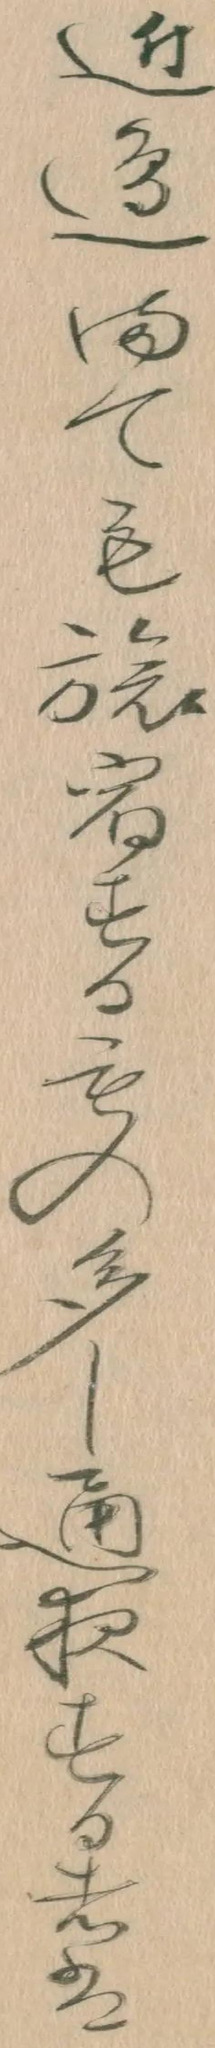近辺まても旅宿するもの多し通夜する者は
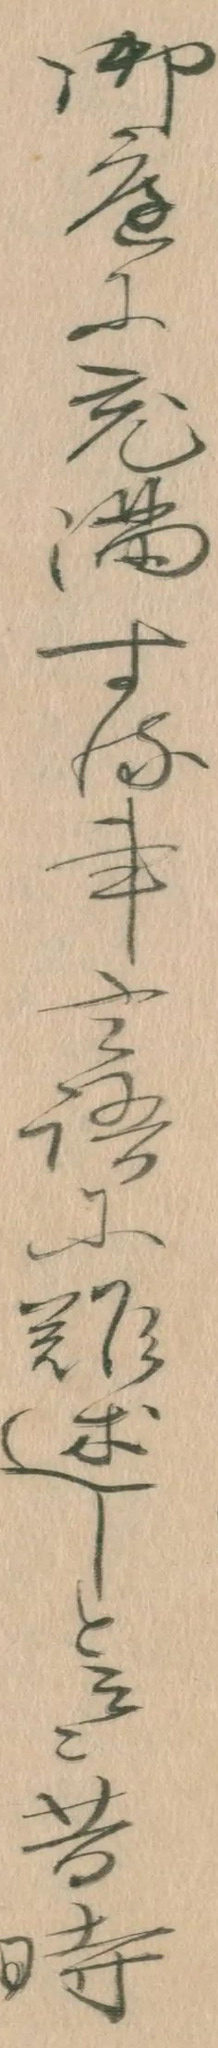御庭に充満する事言語に難述しと云々昔時
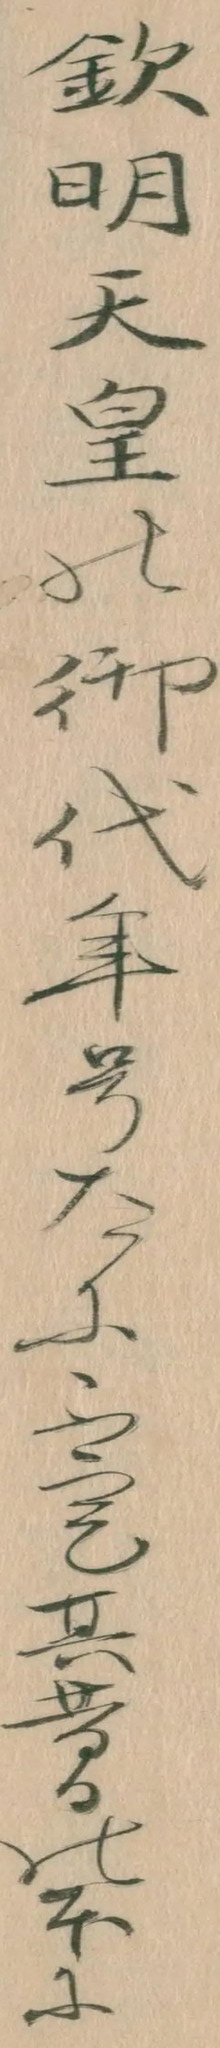欽明天皇の御代年号たに不定其昔日の本に
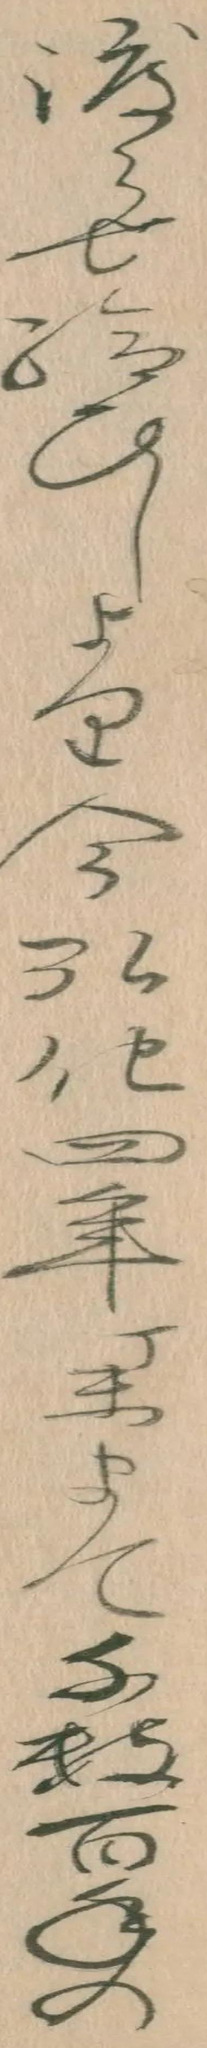渡らせ給ひしより今弘化四年丁未まて年数百年の
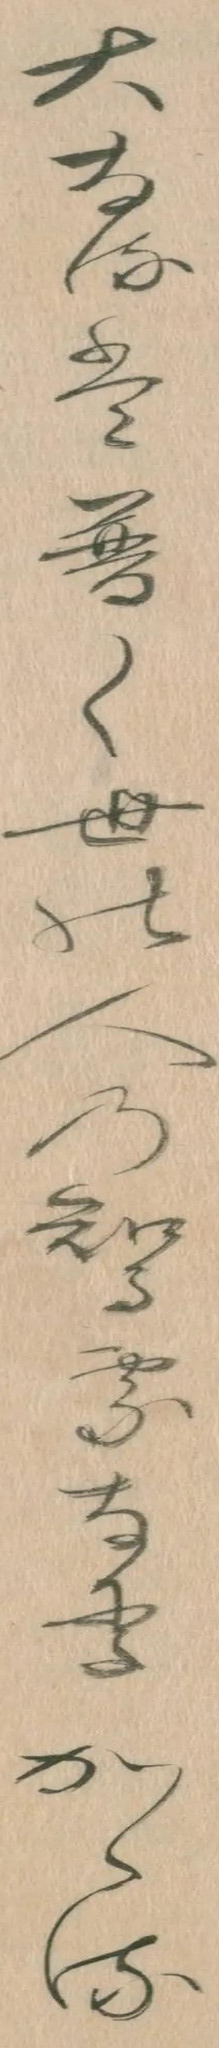大なるは普く世の人の知る処なりかゝる
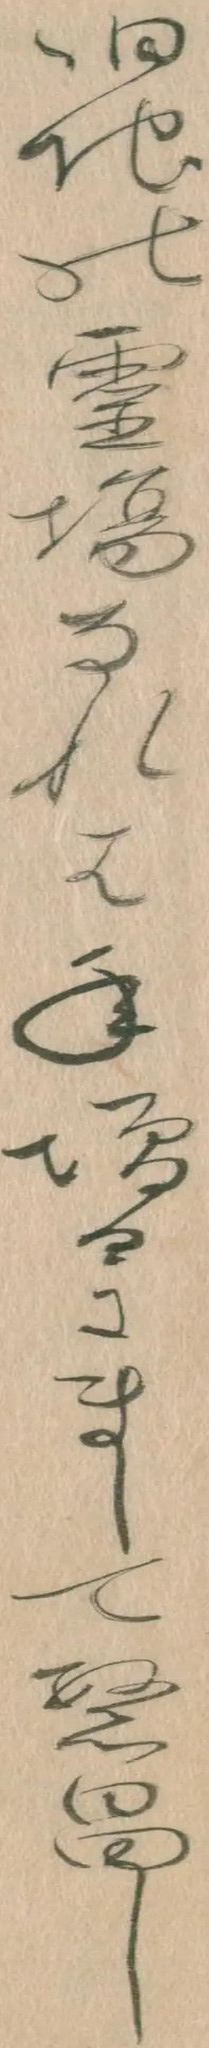旧地の霊場なれは年増日にまして繁昌し
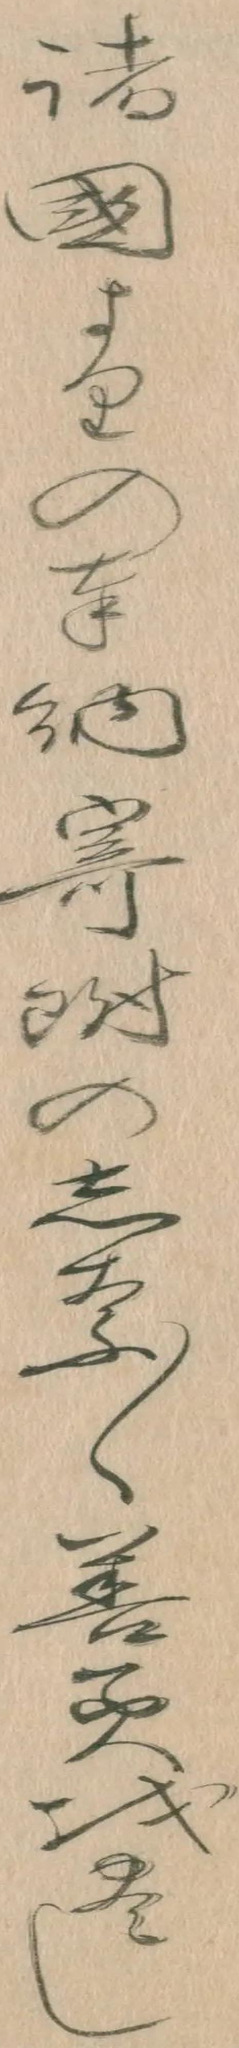諸国よりの奉納寄附のしふ〳〵善美を巻し
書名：俗語之種. [1]
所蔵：国立国会図書館 National Diet Library, JAPAN
